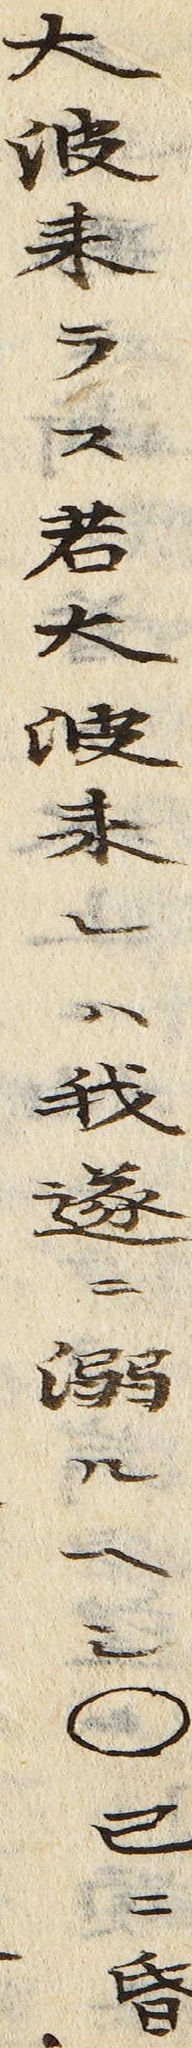大波来ラス若大波来レハ我遂ニ溺ルヘシ◯已ニ昏
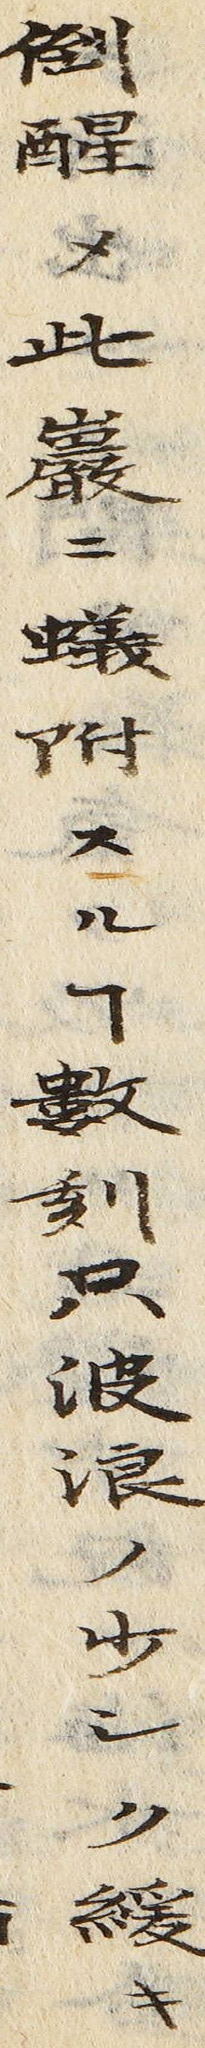倒醒シテ此巌ニ蟻附スルコト数刻只波浪ノ少シク緩キ
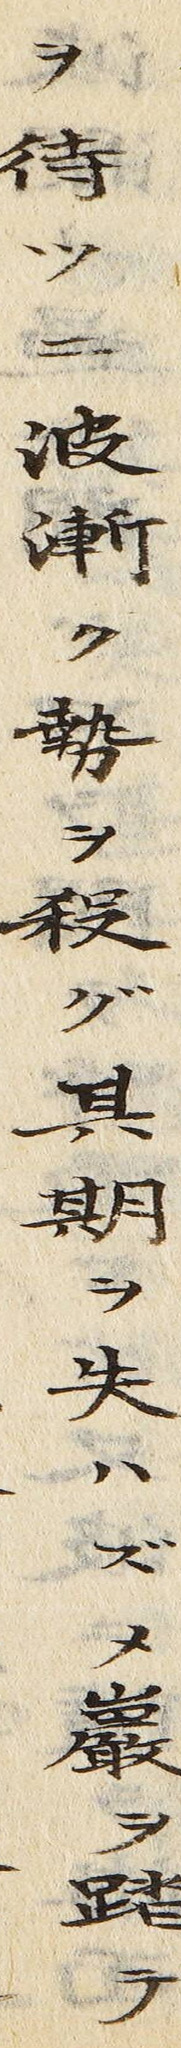ヲ待ツニ波漸ク勢ヲ殺グ其期ヲ失ハズシテ巌ヲ踏テ
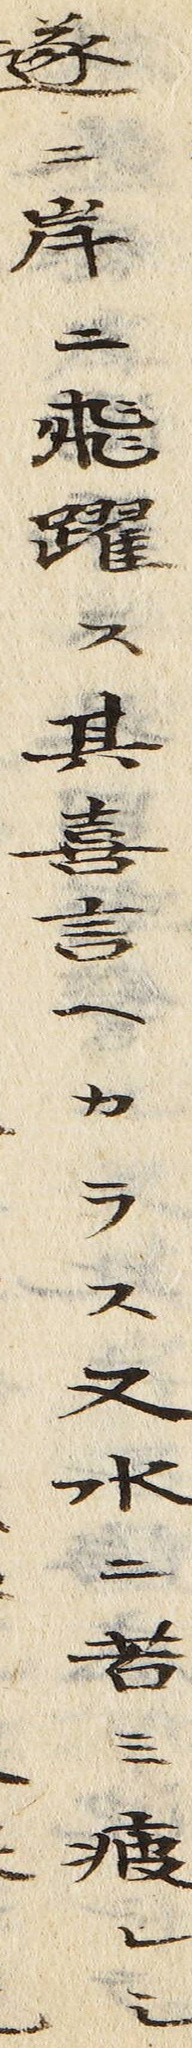遂ニ岸ニ飛躍ス其喜言ヘカラス又水ニ苦ミ疲レシ
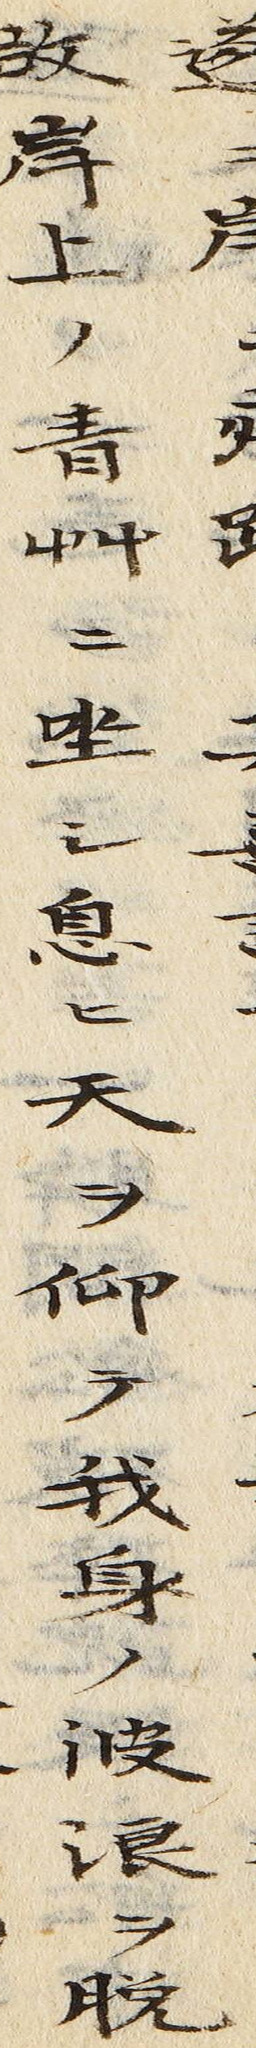故岸上ノ青草ニ坐シ息ヒ天ヲ仰テ我身ノ波浪を脱
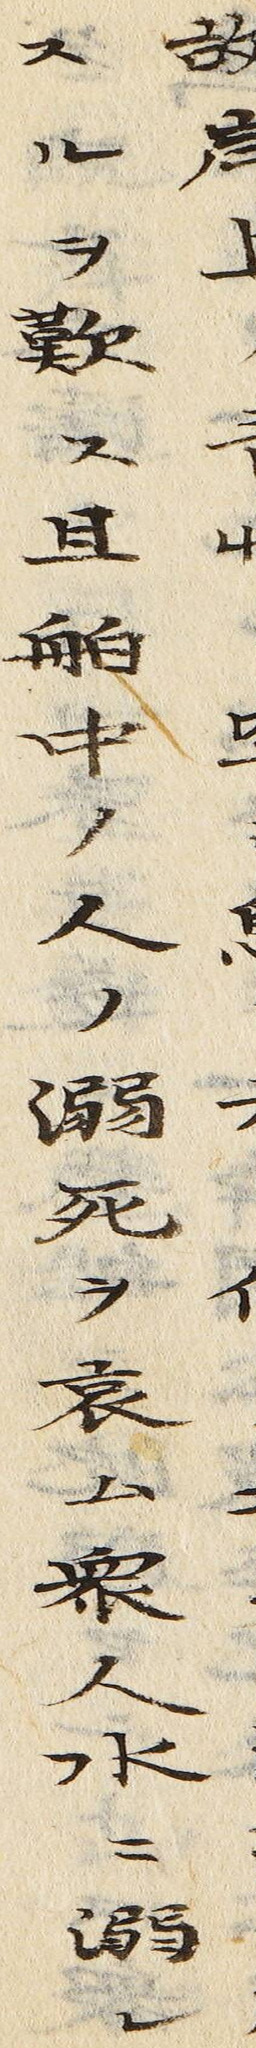スルヲ歎ス且舶中ノ人ノ溺死ヲ哀ム衆人水ニ溺れ
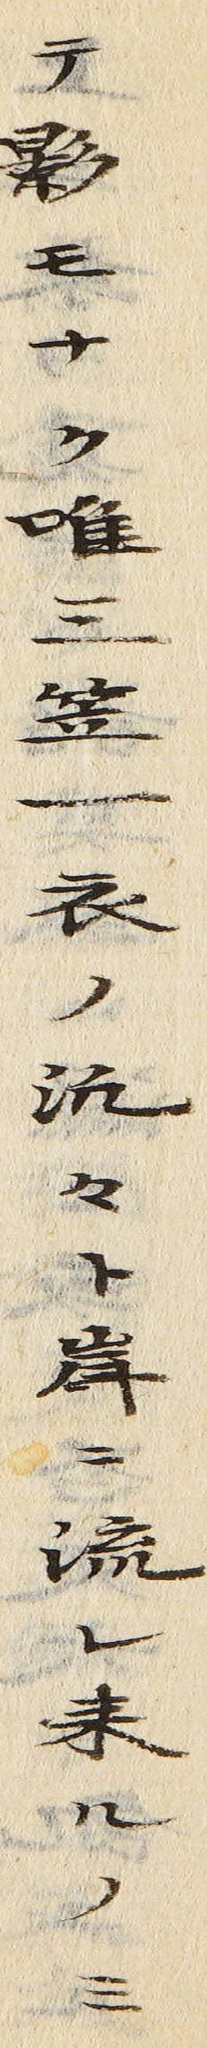テ影モナク唯三笠一衣ノ汎々ト岸ニ流レ来ルノミ
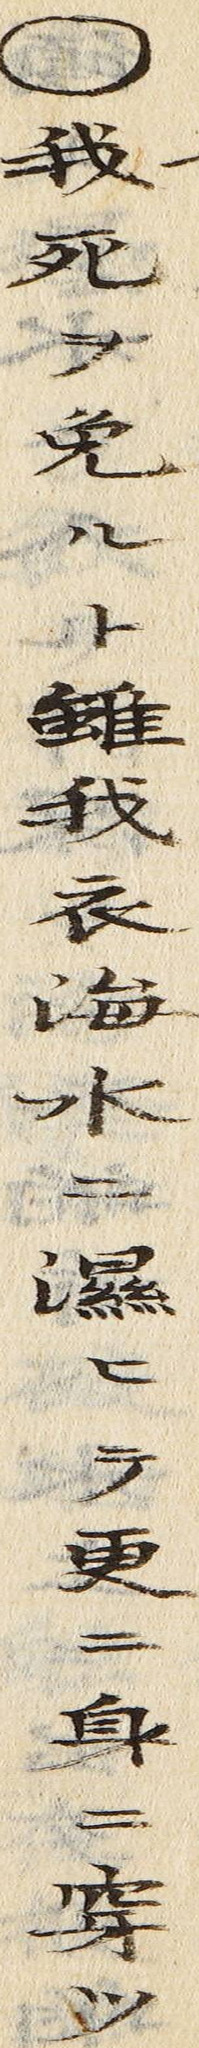◯我死ヲ免ルト雖我衣海水ニ湿ヒテ更ニ身ニ穿ツ
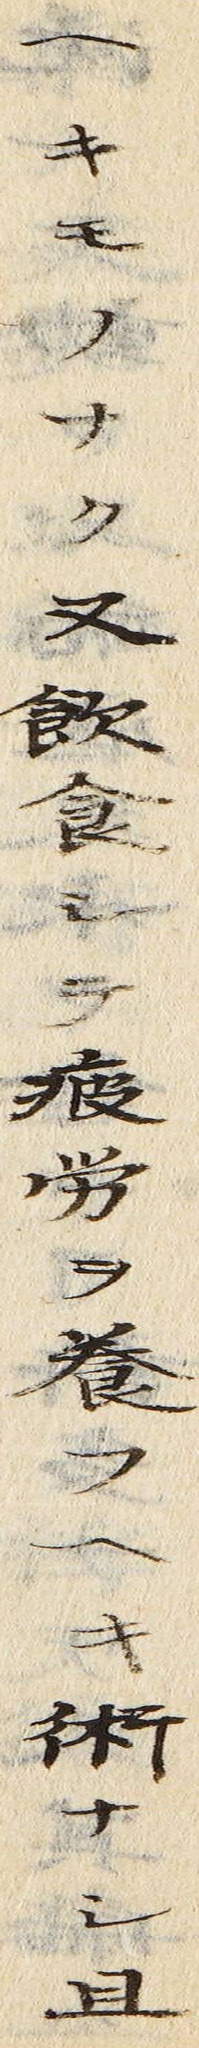ヘキモノナク又飲食シテ疲労ヲ養フヘキ術ナシ且
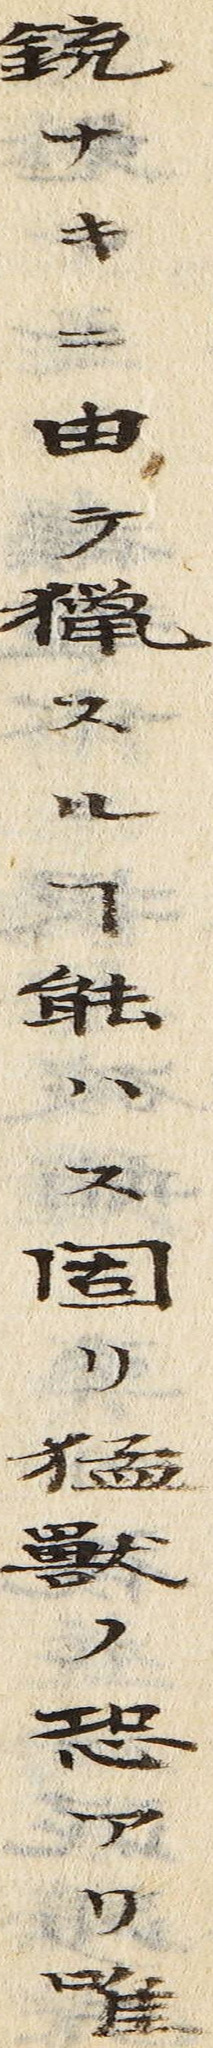銃ナキニ由テ猟スルコト能ハス固リ猛獣ノ恐アリ唯
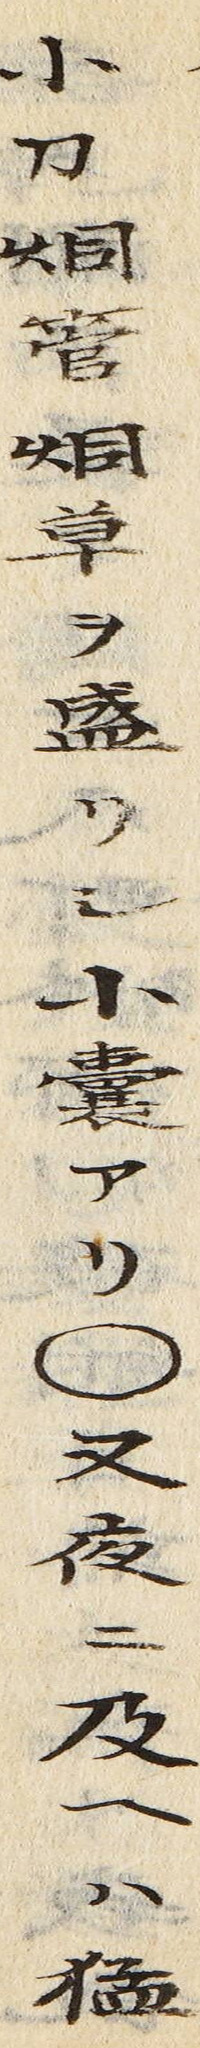小刀煙管煙草ヲ盛リシ小嚢アリ◯又夜ニ及ヘハ猛
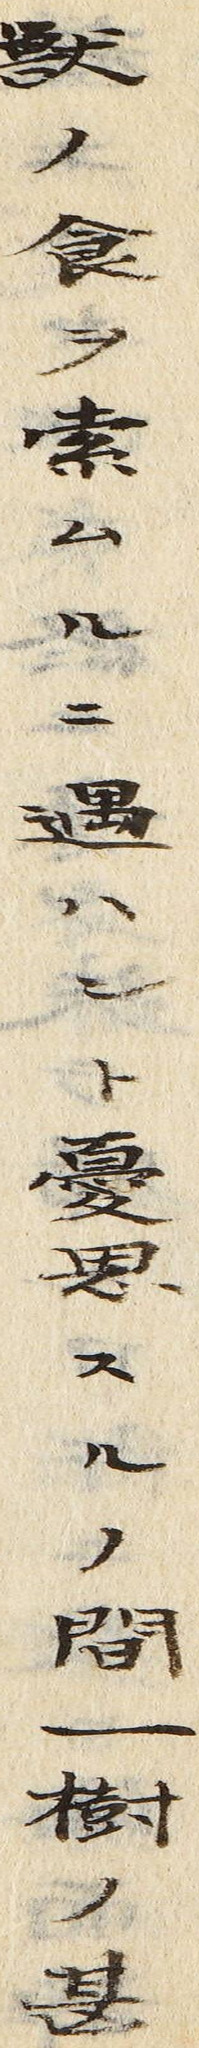獣ノ食ヲ索ムルニ遇ハント憂思スルノ間一樹ノ甚
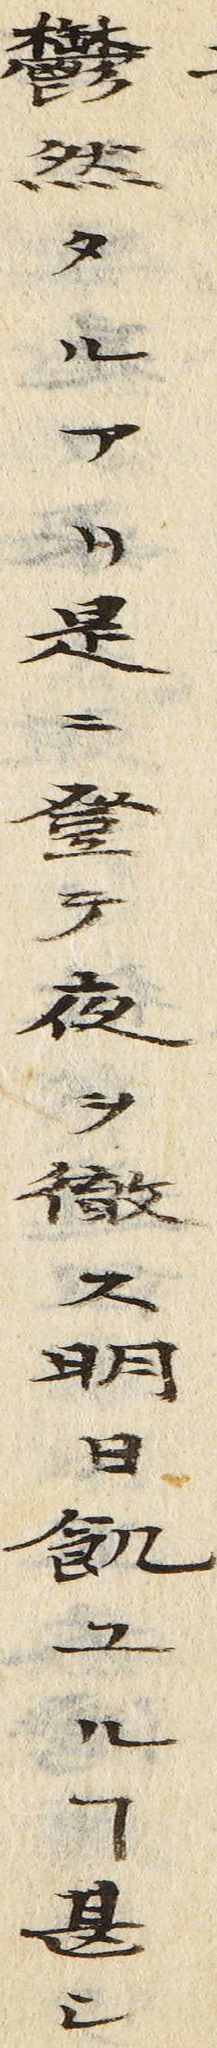鬱然タルアリ是ニ登テ夜ヲ徹ス明日飢ユルコト甚シ
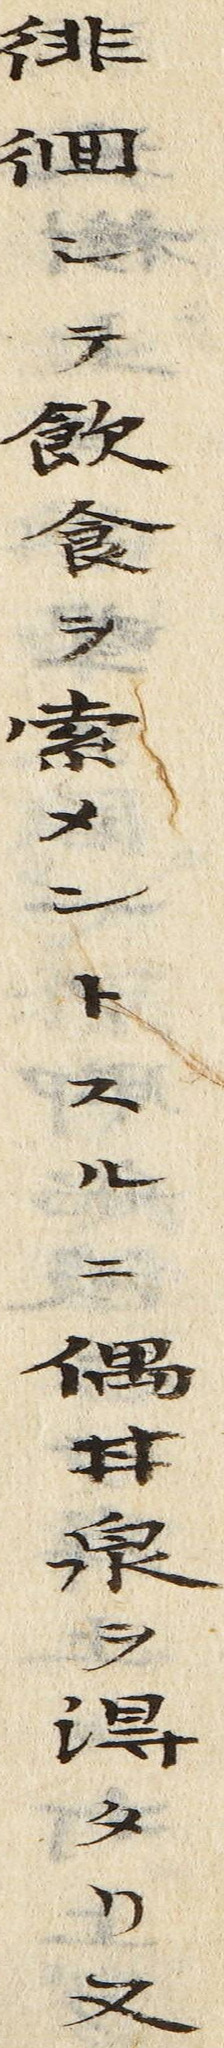徘徊シテ飲食ヲ索メントスルニ偶井泉ヲ得タリ又
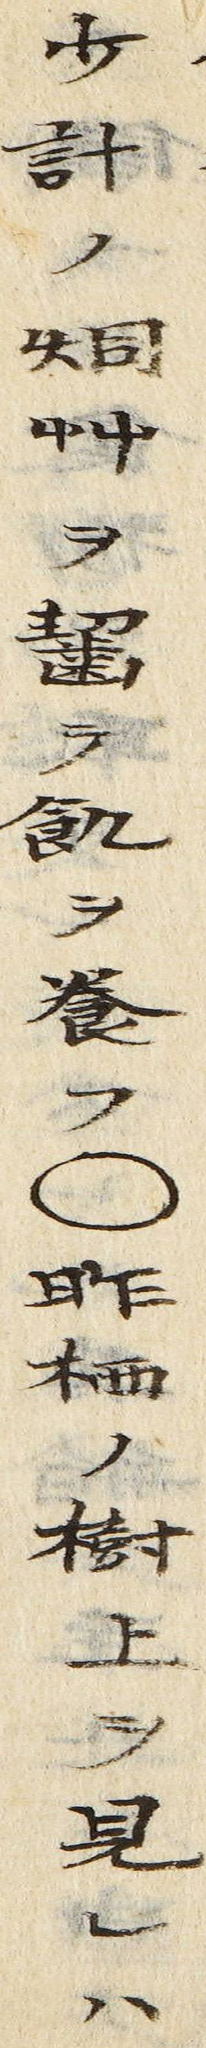少計ノ煙草ヲ齧テ飢ヲ養フ◯昨栖ノ樹上ヲ見レハ
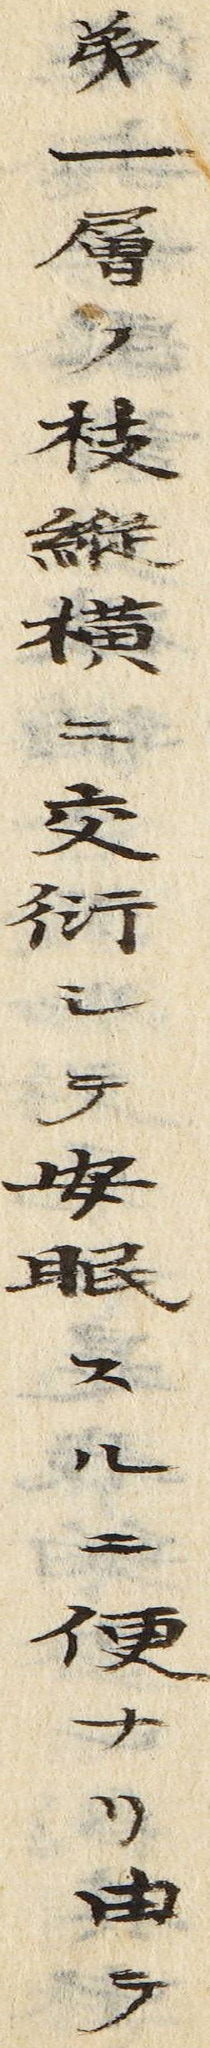第一層ノ枝縦横ニ交衍シテ安眠スルニ便ナリ由テ
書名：漂流紀事
